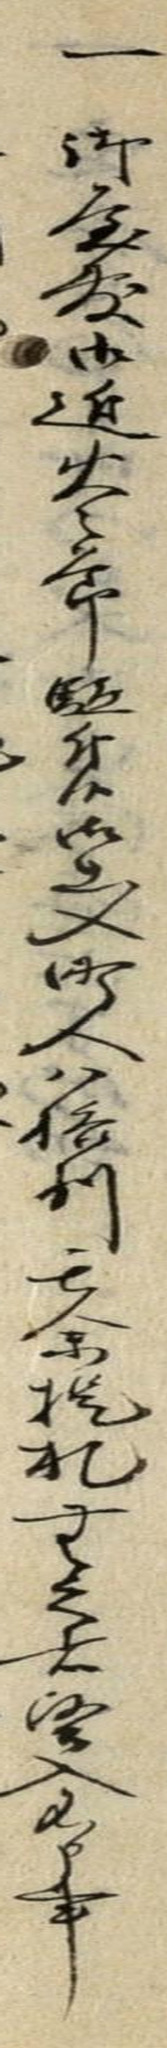一御屋敷御近火之節駆付候御出入町人は格別其余提札無之者堅入不申事
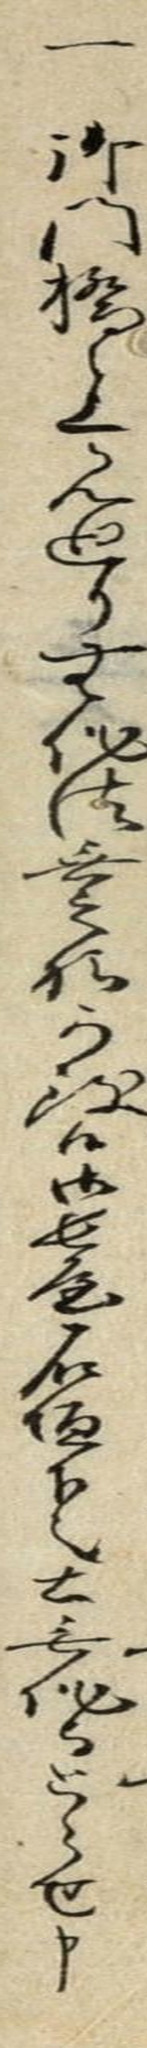一御門橋之上見廻り無作法無之様可致候御長屋石垣下之土無作ととらせ申
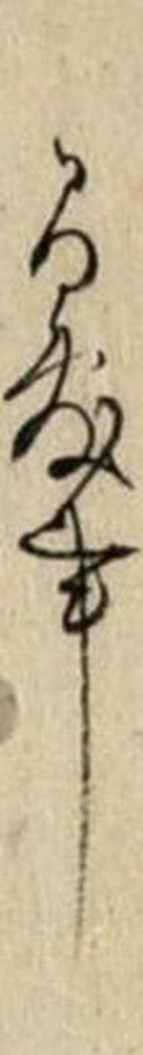間敷事
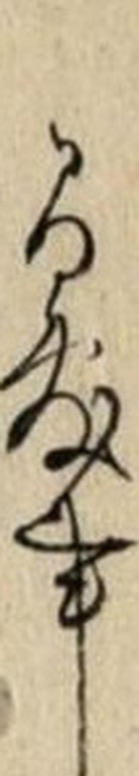間敷事
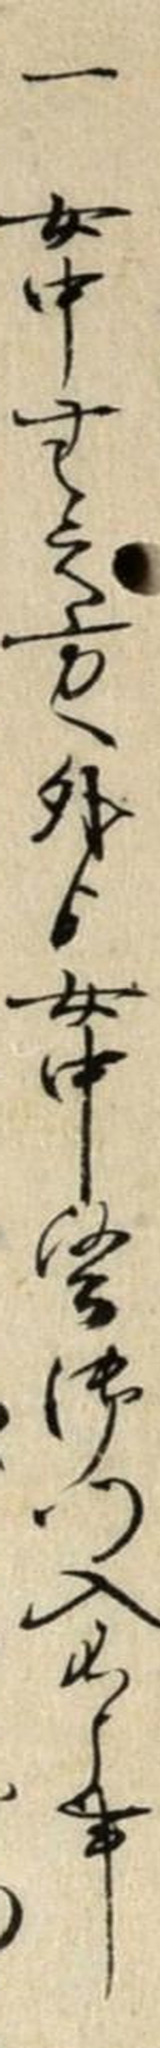一女中無之方へ外ゟ女中堅御門入不申事
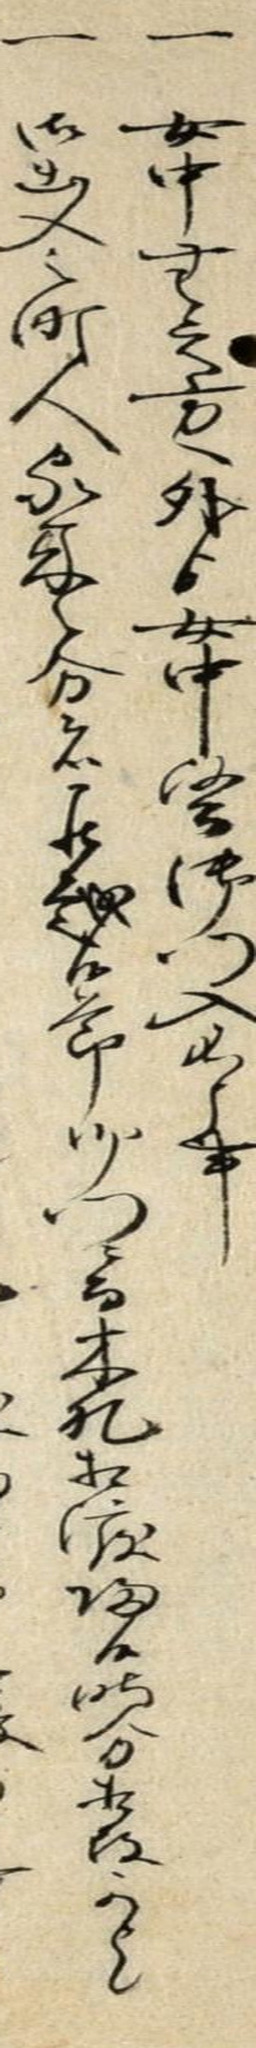一御出入之町人家来之分は罷越候節御門にて木札相渡帰候時分相改可申候
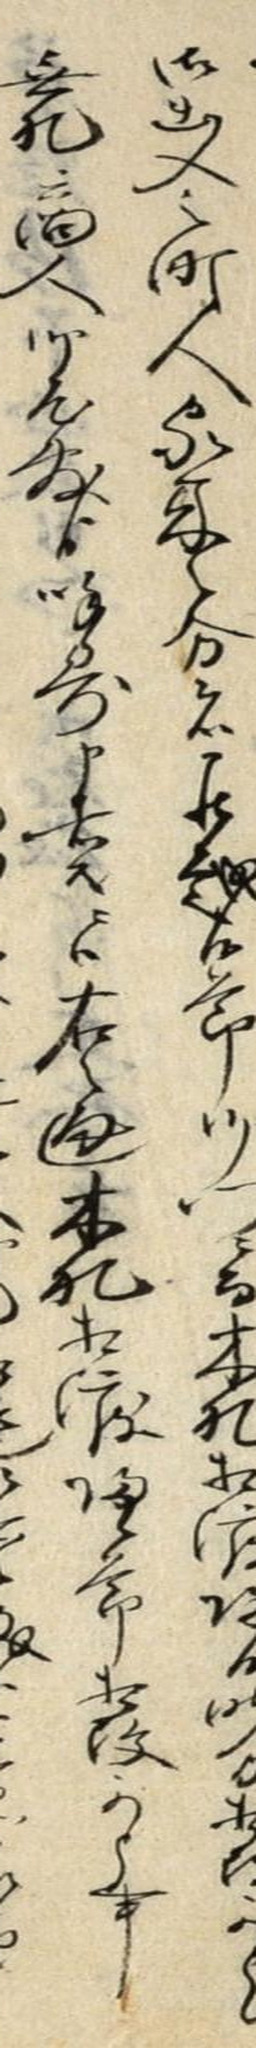無札商人御屋敷ゟ呼寄申者共には右之通木札相渡帰候節相改可申事
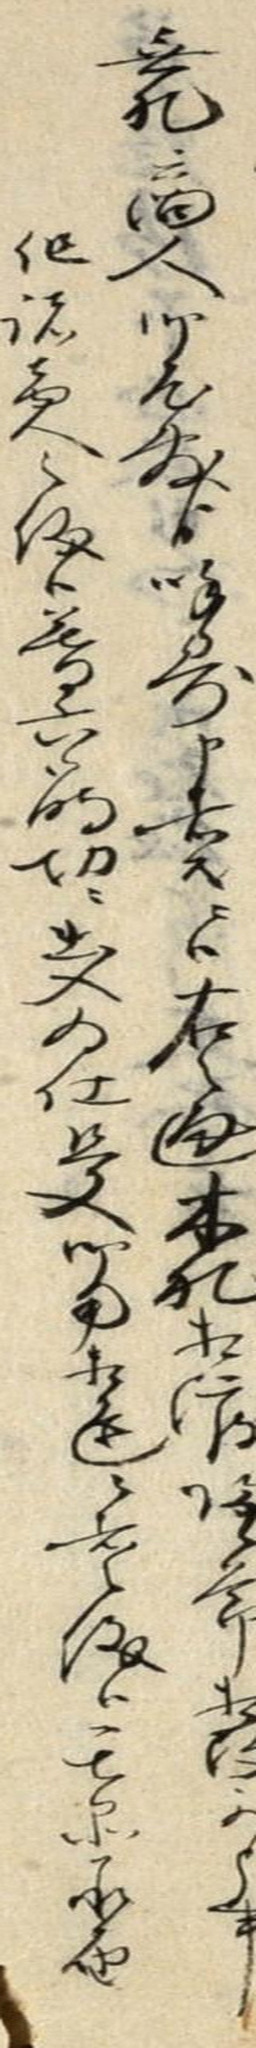但諸商人之儀は暮六ツ時切に出入為仕且又御用相達候者之儀は其品承届
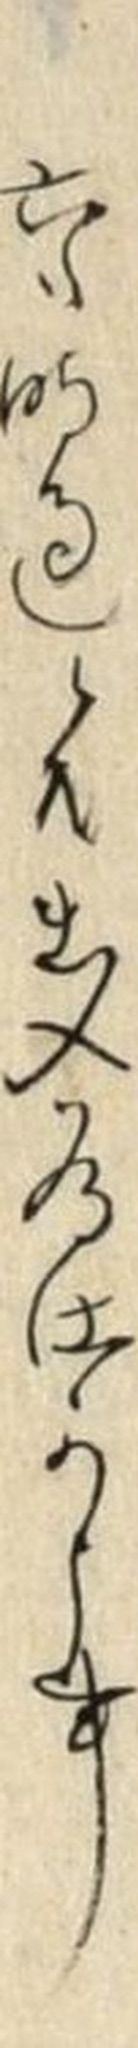六ツ時過候共出入為仕可申事
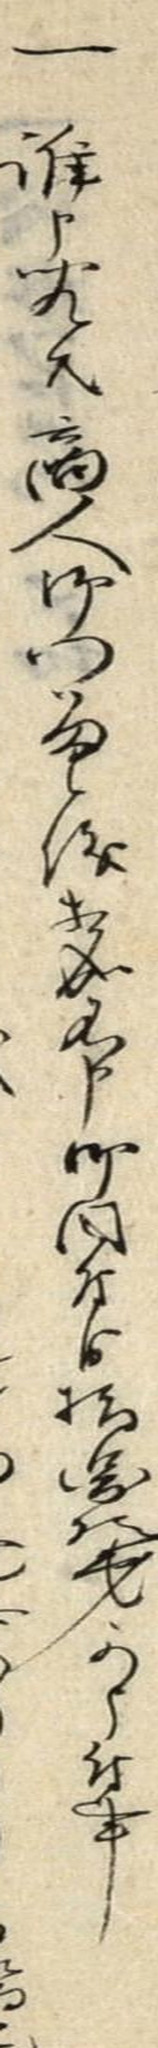一誰申聞候共商人御門留之儀相成不申御目付ゟ指図次第可申付事
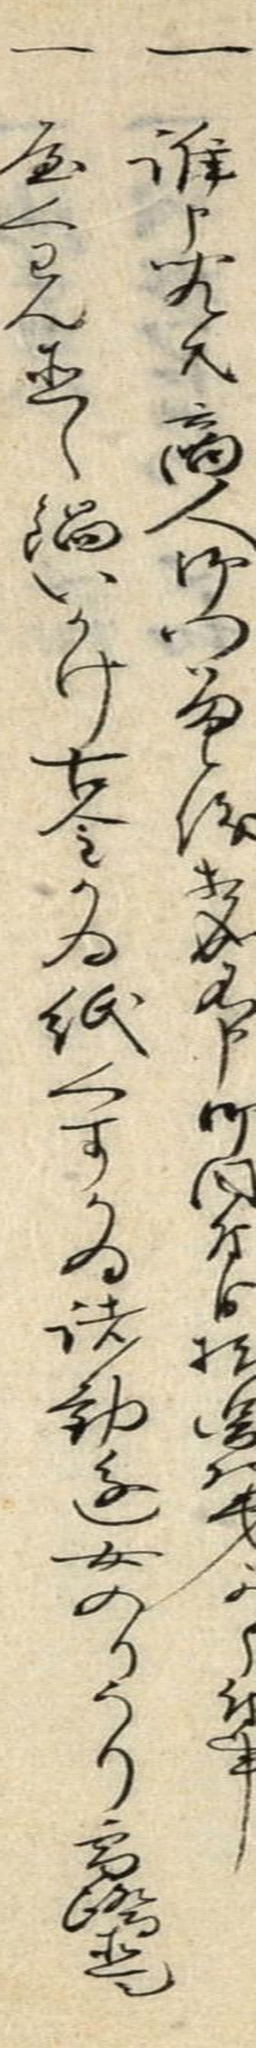一やくわん直し鍋いかけ古金かゐ紙くすかゐ諸勧進女のりうり雪踏直し
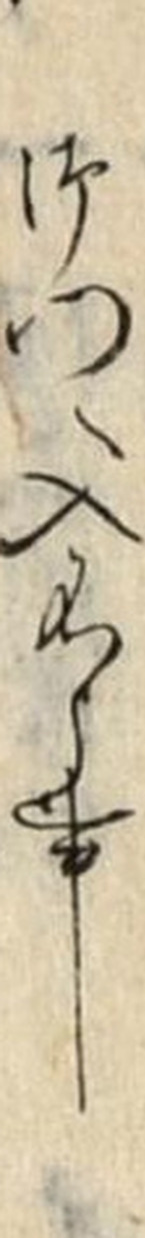御門へ入不申事
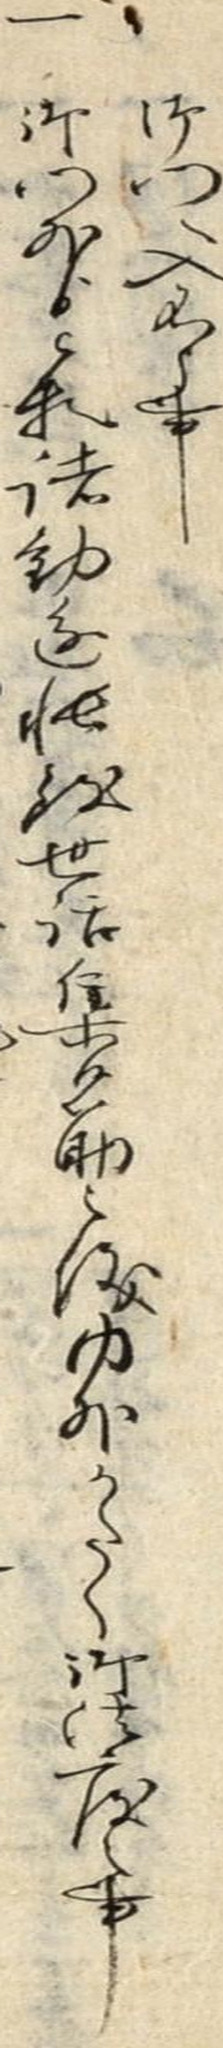一御門外ゟ被頼諸勧進帳致世話集候筋之儀内外かたく御法度之事
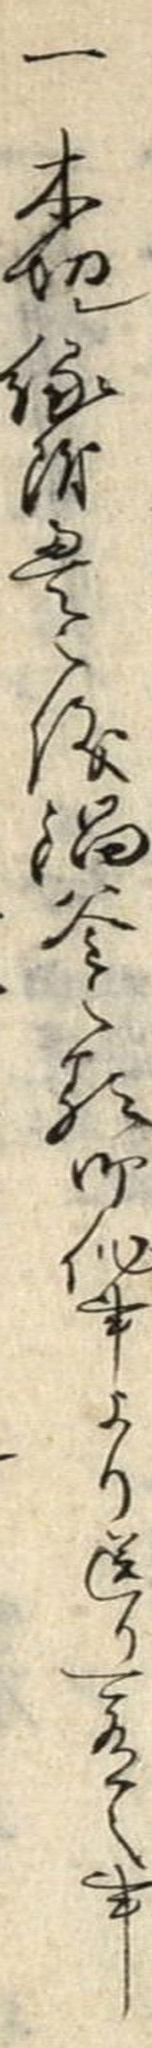一本切れ縁附畳之儀鍋釜之類御作事より送り可有之事
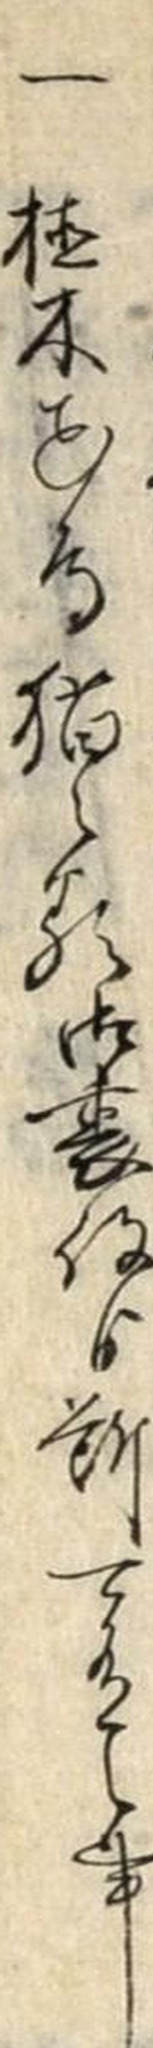一植木花鳥猫の類御裏役ゟ断可有之事

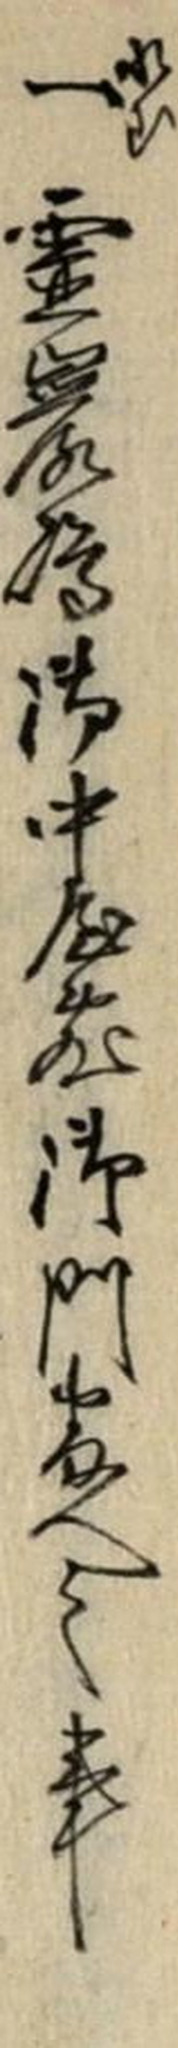一霊巌嶋御中屋敷御門番人之事
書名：三都并道中之部
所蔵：福井県文書館 Fukui Prefectural Archives
